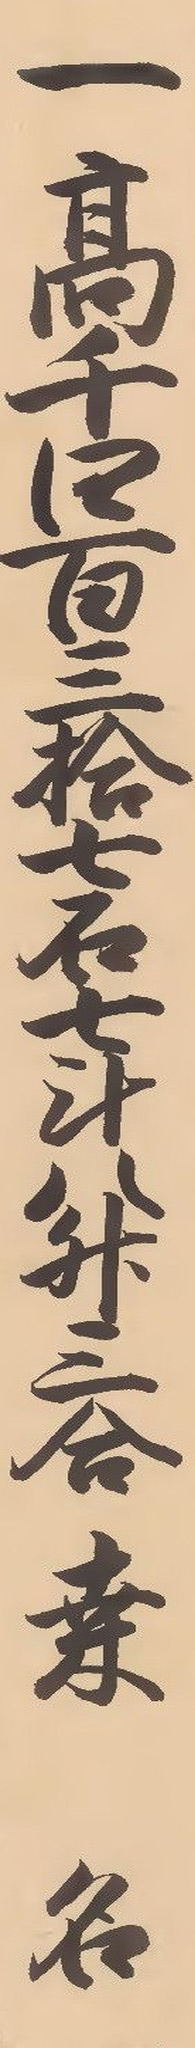一高千四百三拾七石七斗八升三合桑名

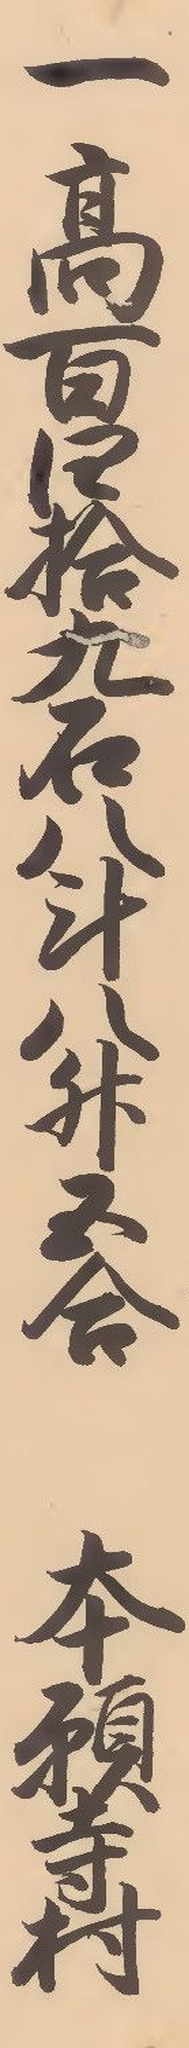一高百四拾九石八斗八升五合本願寺村
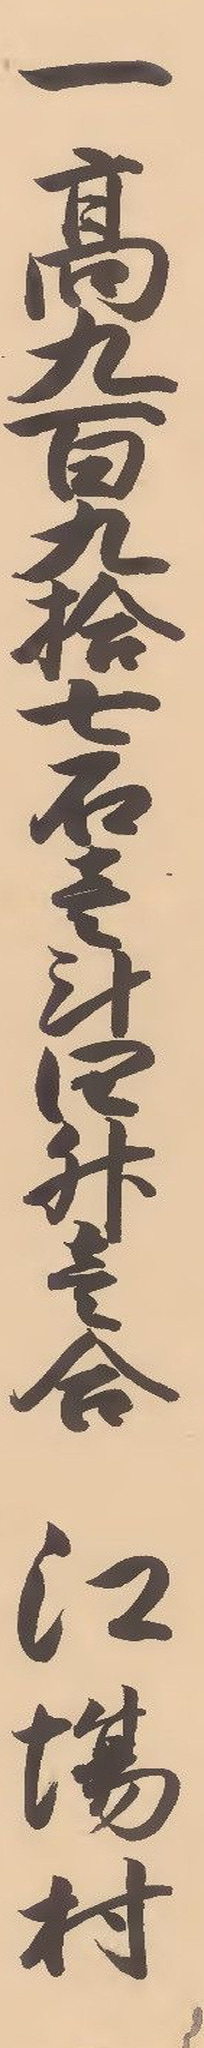一高九百九拾七石壱斗四升壱合江場村
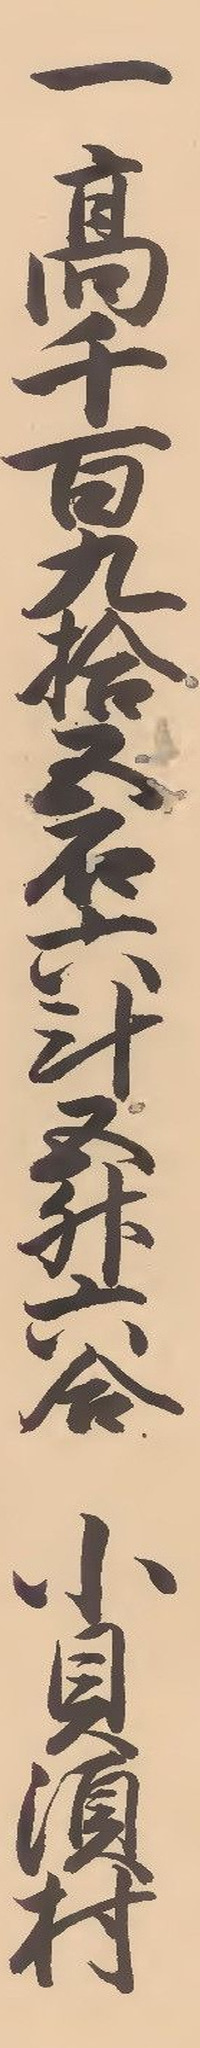一高千百九拾五石六斗五升六合小貝須村
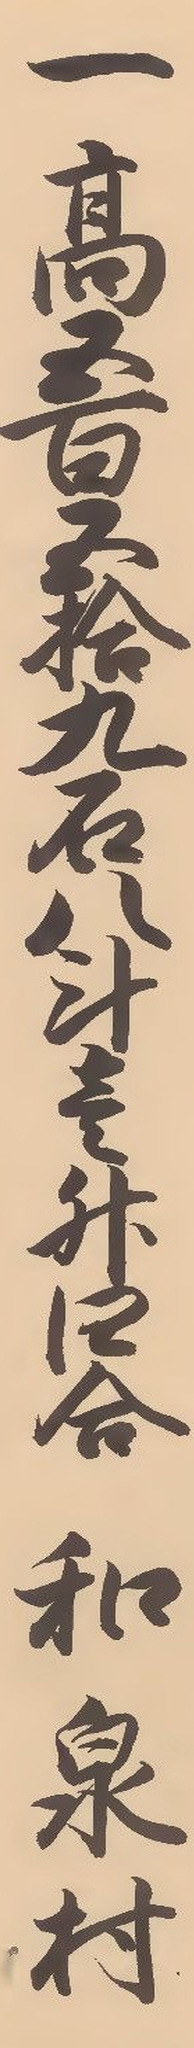一高五百五拾九石八斗壱升四合和泉村
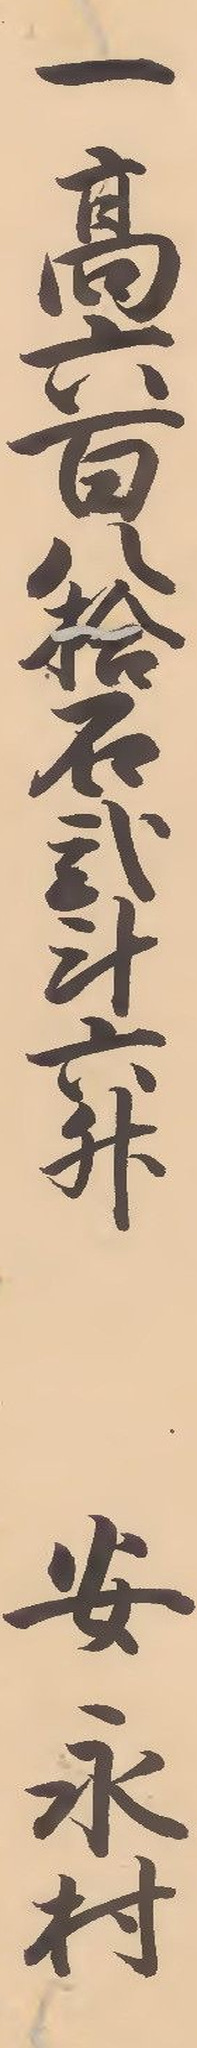一高六百八拾石弐斗六升安永村

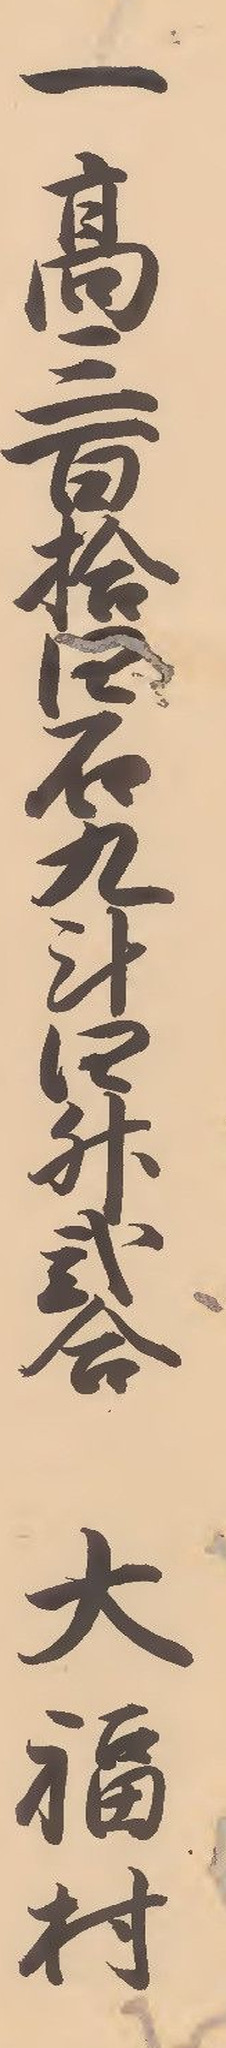一高三百拾四石九斗四升弐合大福村
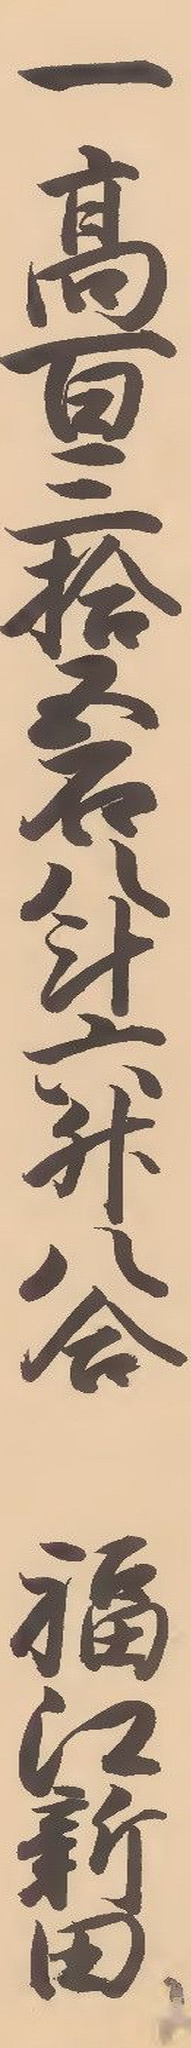一高百三拾五石八斗六升八合福江新田
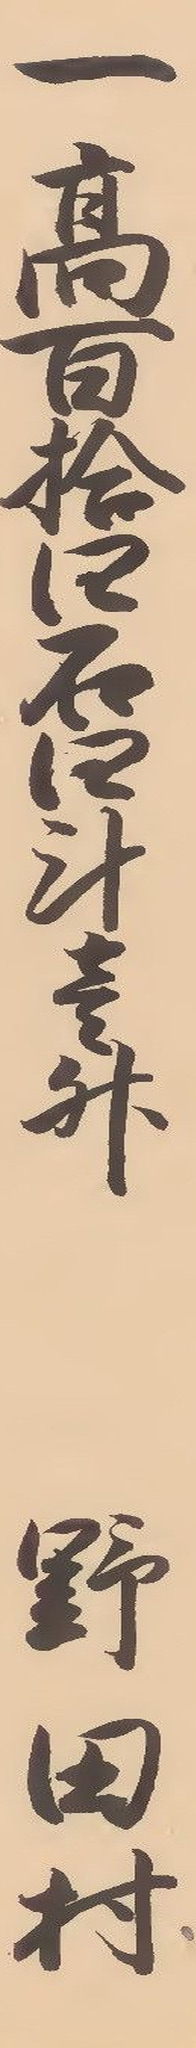一高百拾四石四斗壱升野田村
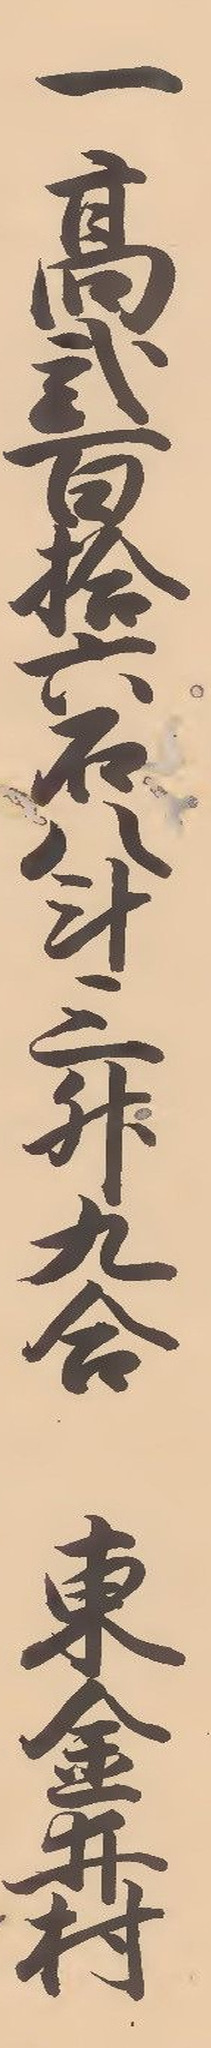一高弐百拾六石八斗三升九合東金井村
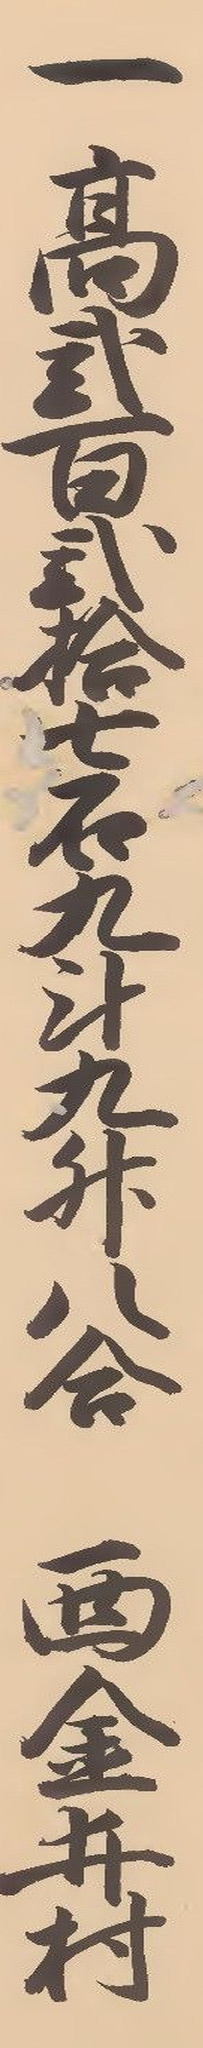一高弐百弐拾七石九斗九升八合西金井村
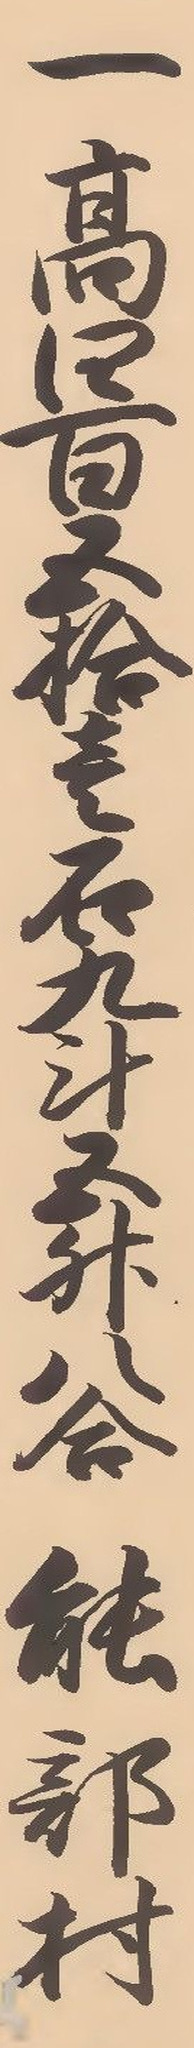一高四百五拾壱石九斗五升八合能部村
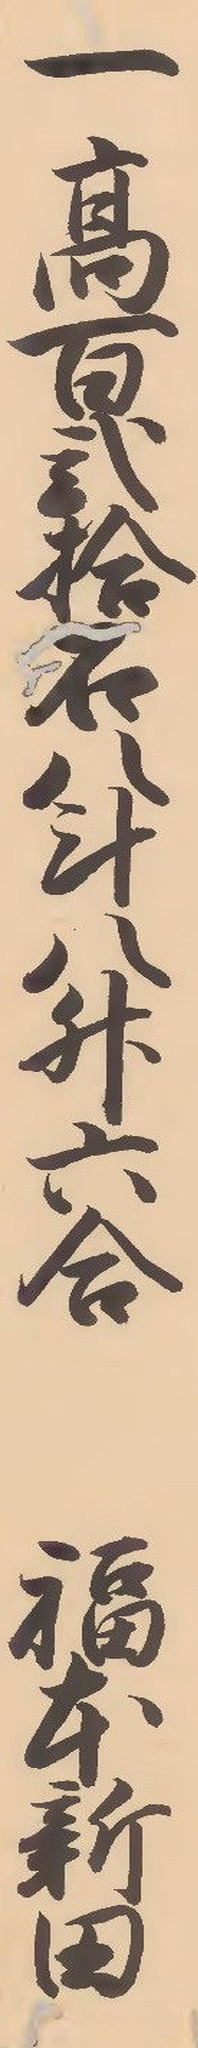一高百弐拾石八斗八升六合福本新田

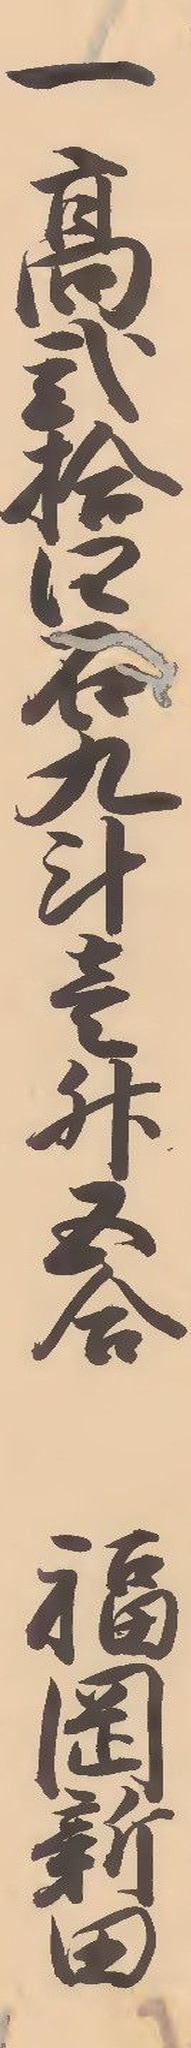一高弐拾四石九斗壱升五合福岡新田
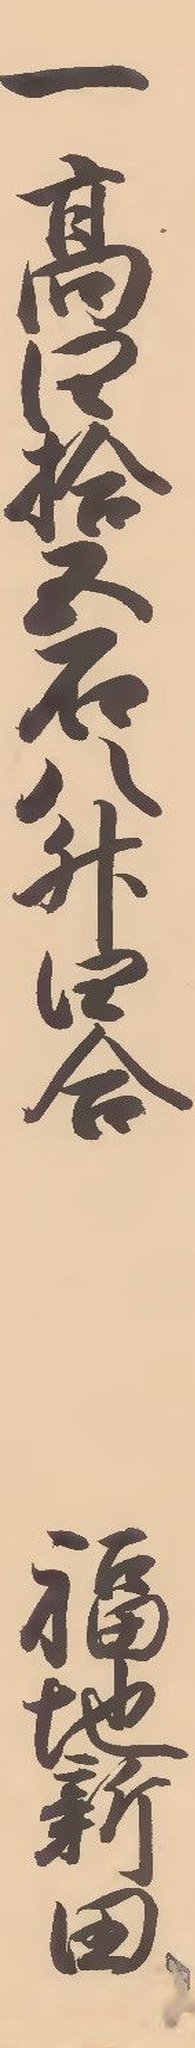一高四拾五石八升四合福地新田
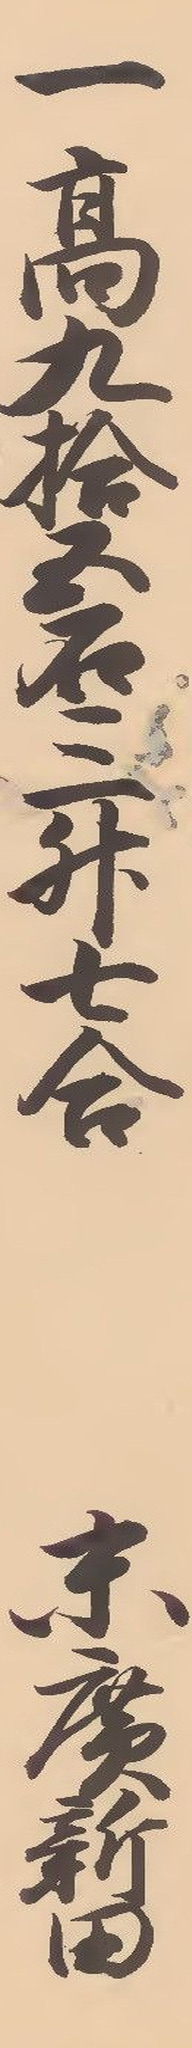一高九拾五石三升七合末広新田
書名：伊勢国郷帳
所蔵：国立公文書館 National Archives of Japan
